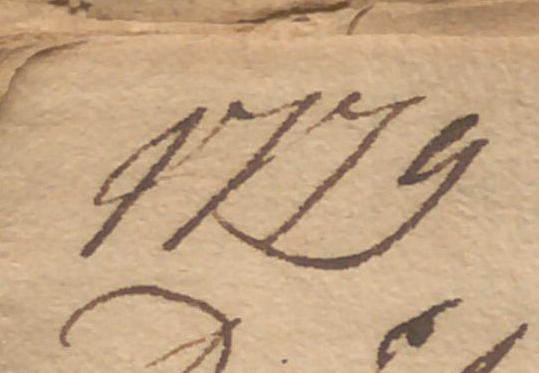1779
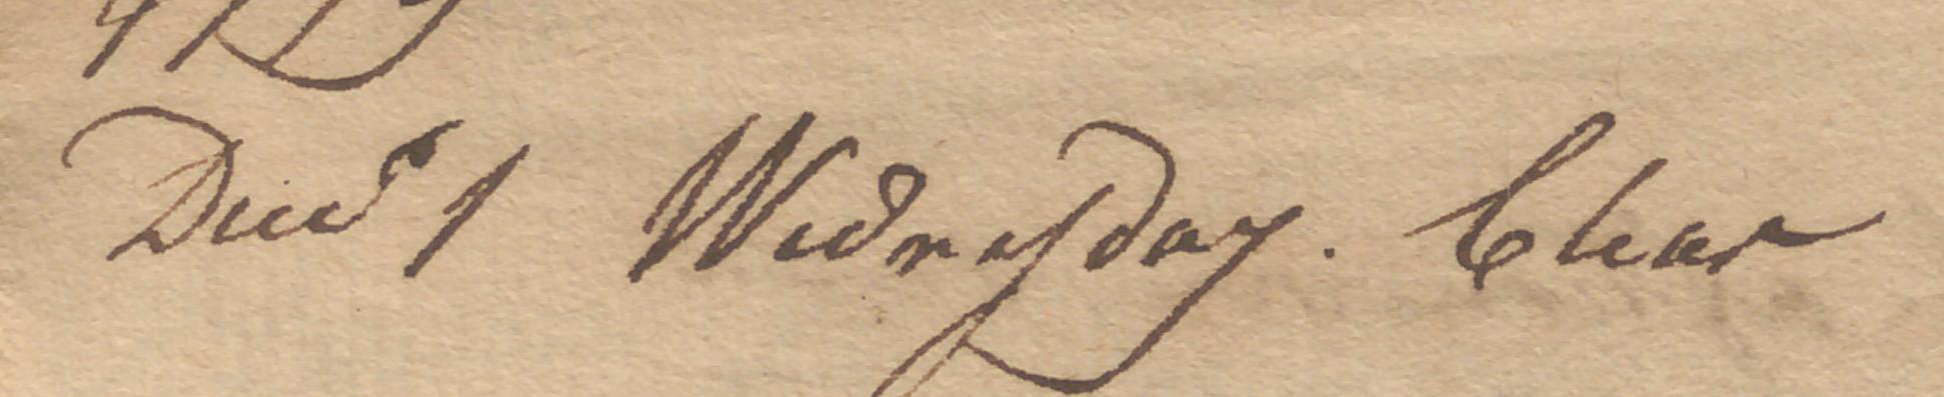Dec^r Wednesday. Clear
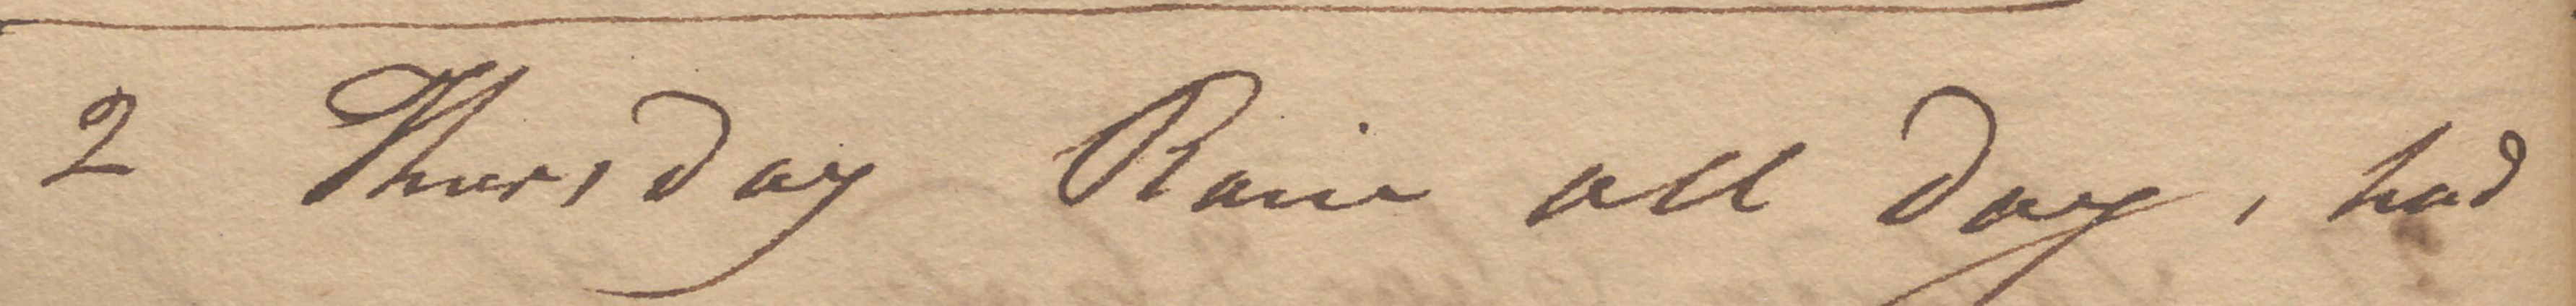2 Thursday Rain all day, had
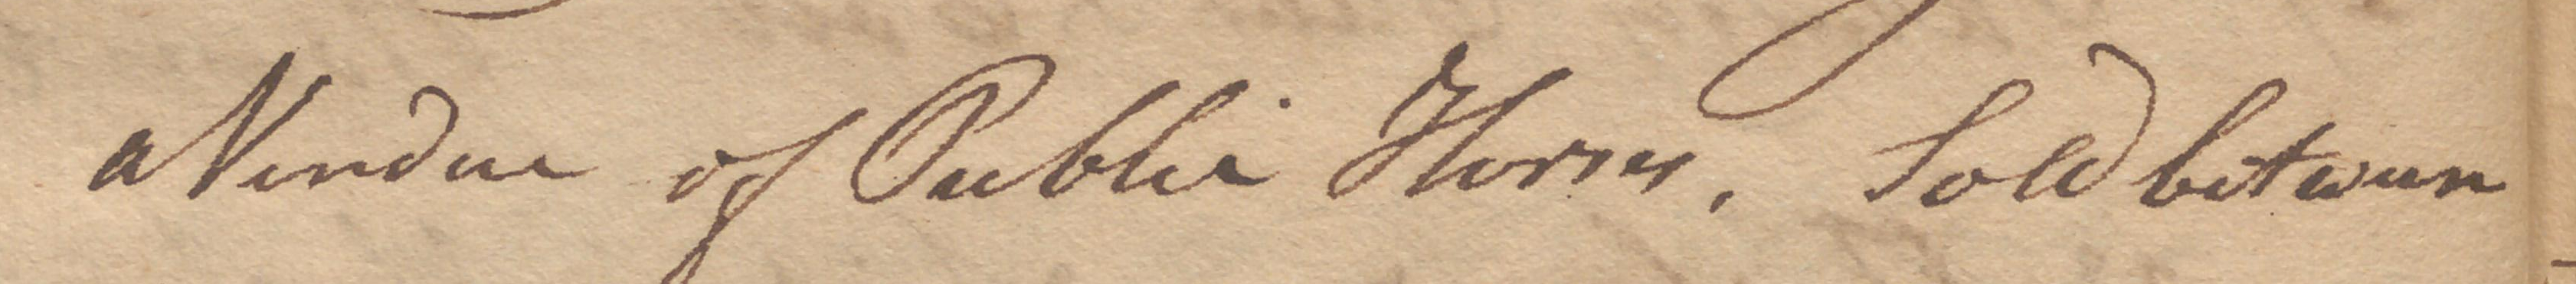a Vendue of Public Horses. Sold between
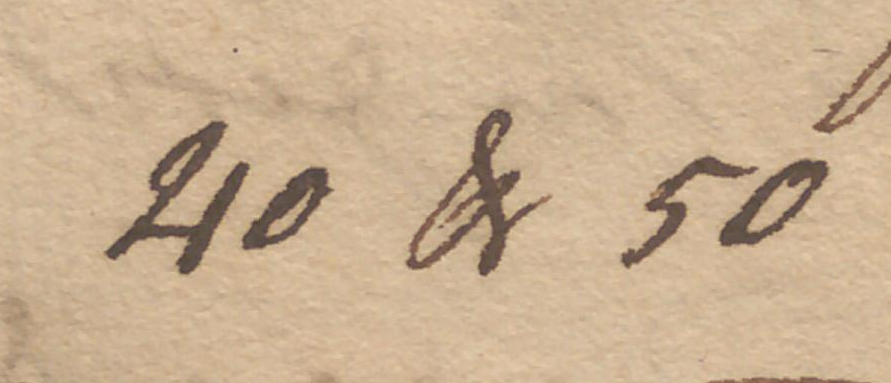40 & 50
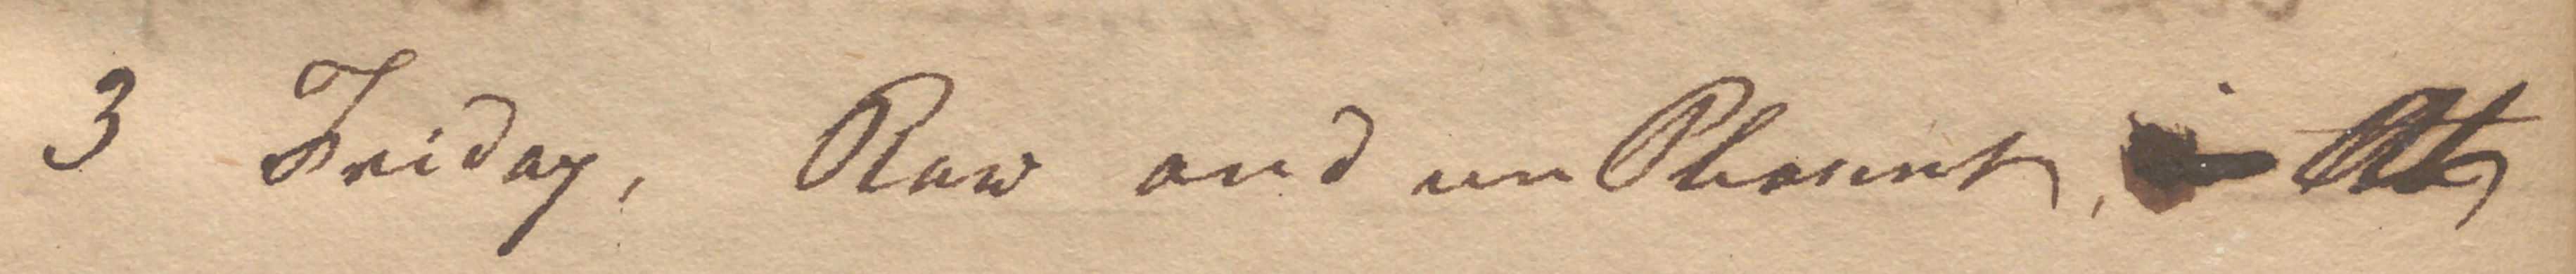3 Friday, Raw and unPleasent, [__] At
